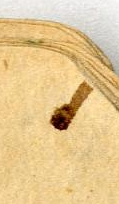1
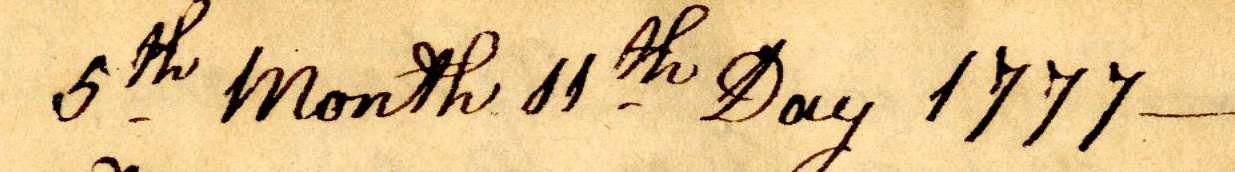5^th Month 11^th Day 1777-
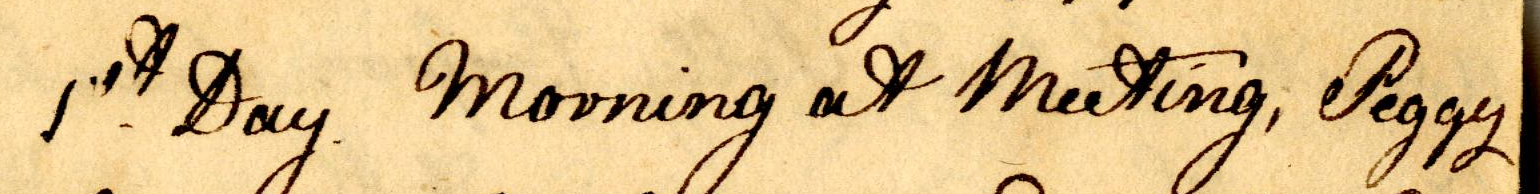1^st Day. Morning at Meeting, Peggy
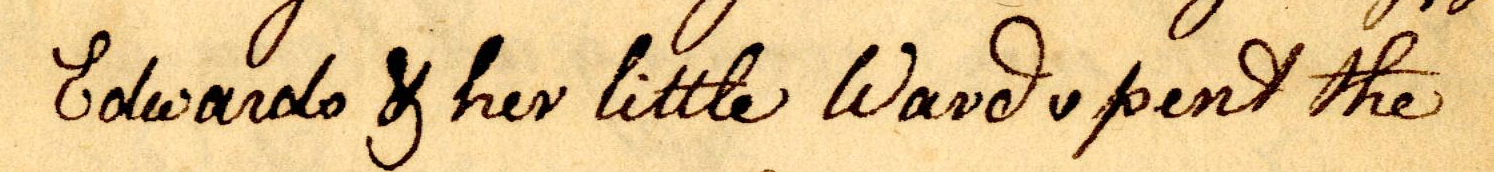Edwards & her little Ward spent the
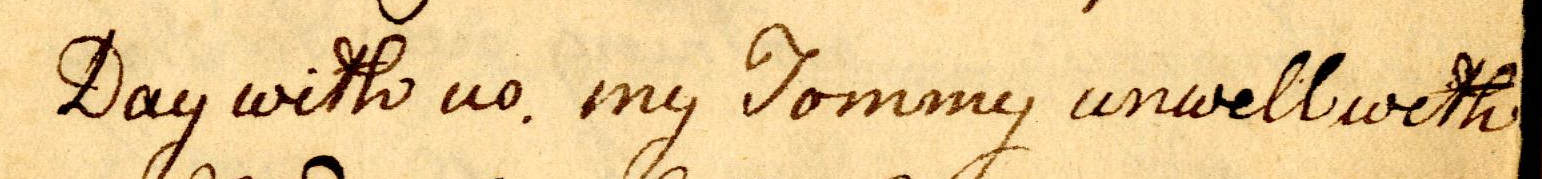Day with us. my Tommy unwell with
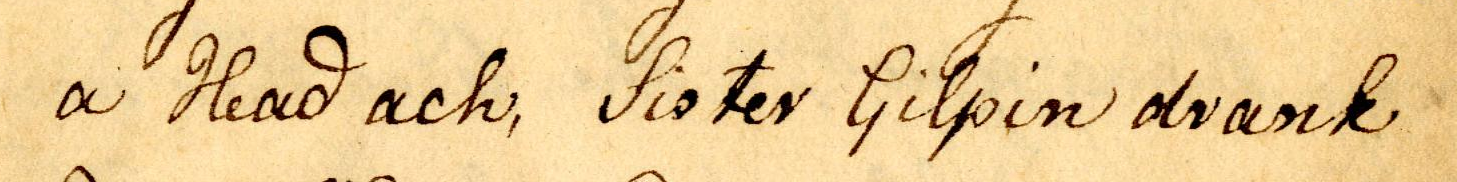a Head ach, Sister Gilpin drank
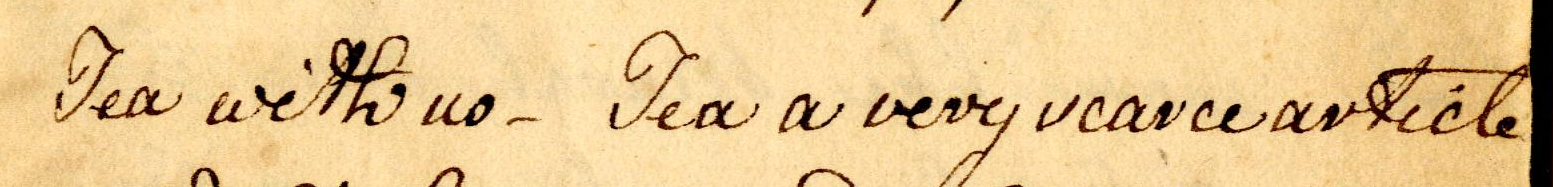Tea with us- Tea a very scarce article
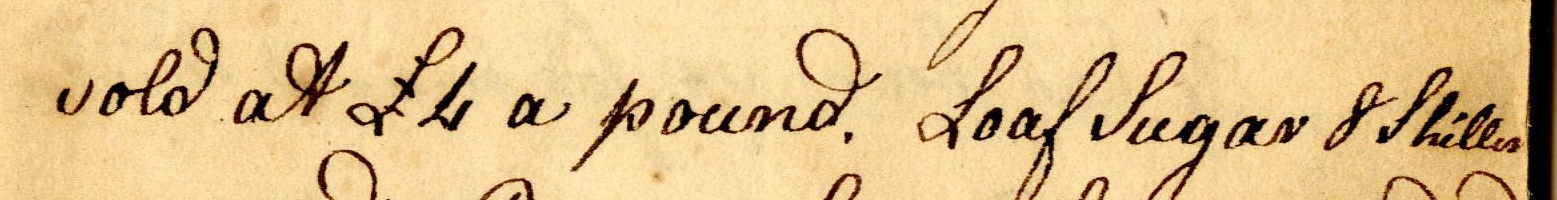sold at £4 a pound. Loaf Sugar 8 Shillis
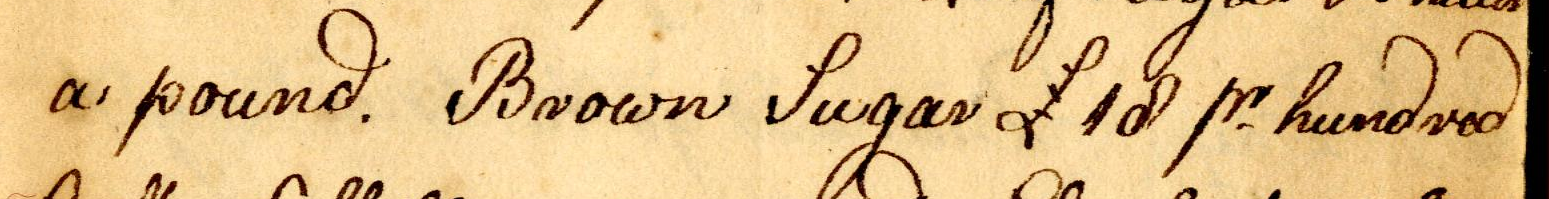a pound. Brown Sugar £18 per hundred
